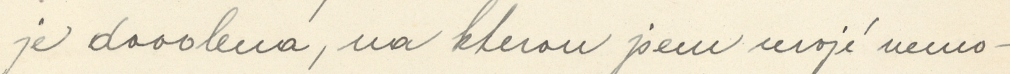je dovolená, na kterou jsem mojí nemo-
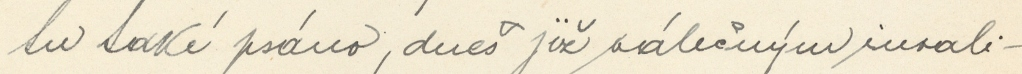tu také psáno, dnes již válečným invali-
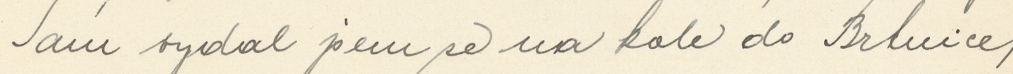Sám vydal jsem se na kole do Brtnice,
